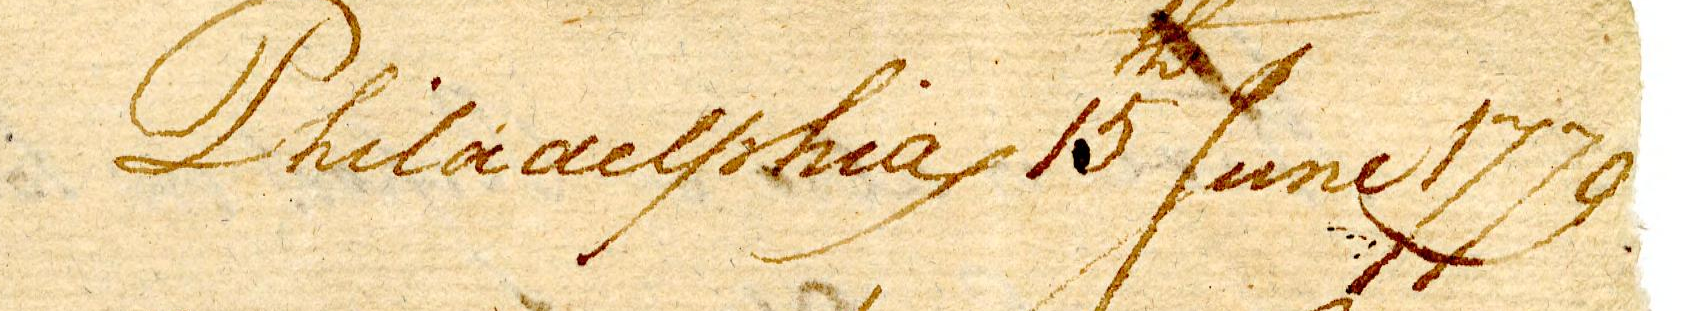Philadelphia 15^th June 1779
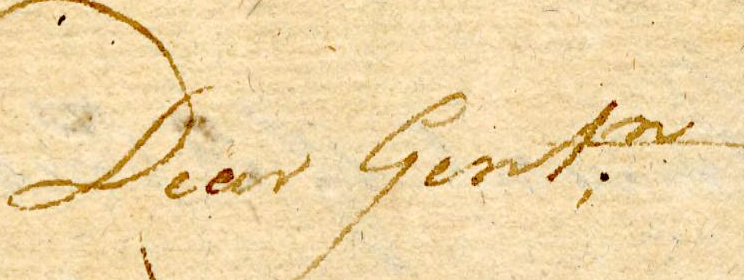Dear Gent^n.
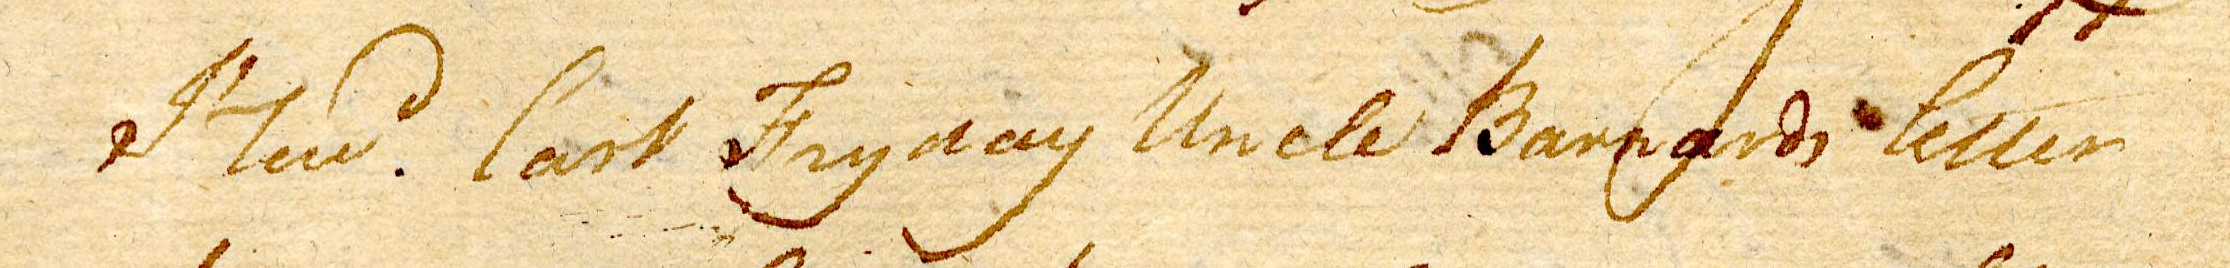I rec^d. last Fryday Uncle Barnards letter
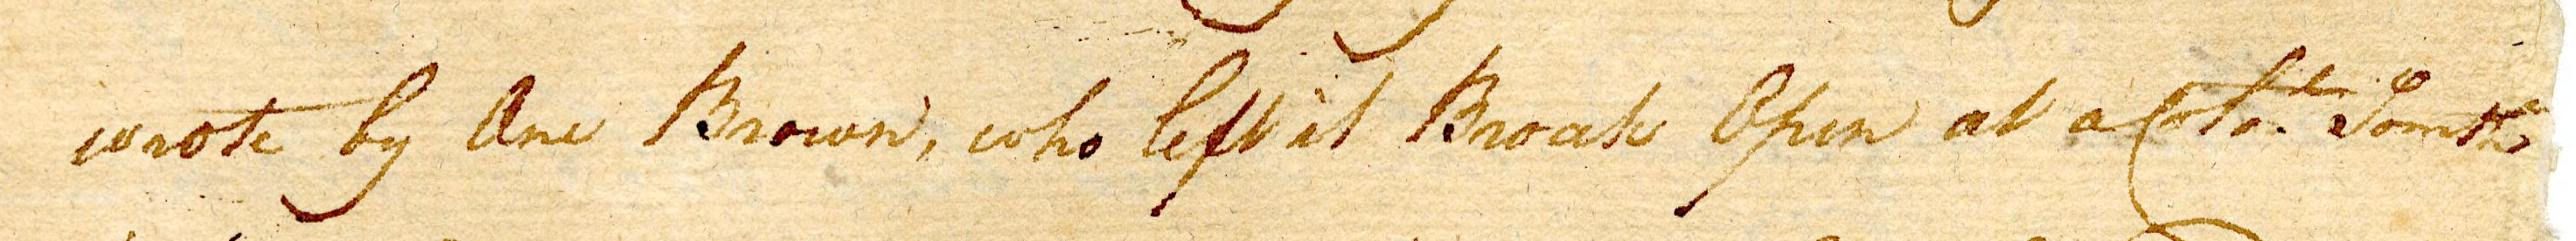wrote by Ane Brown, who left it Broak open at a Colo^l. someth-
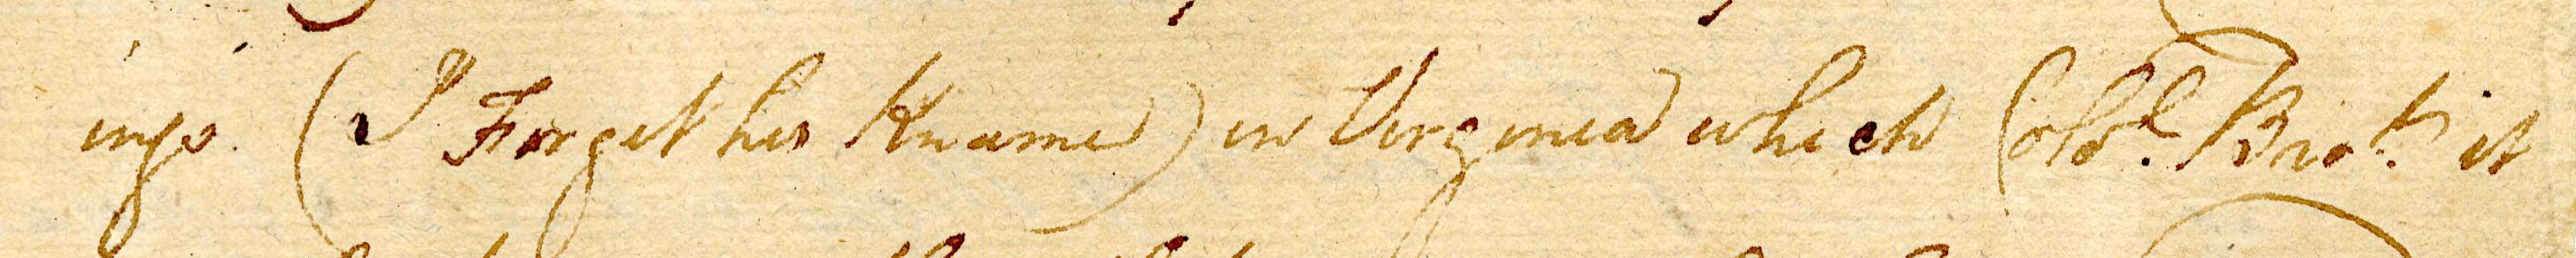-ings (I Forget his Kname) in Virginia which Colo^l. Bro^t. it
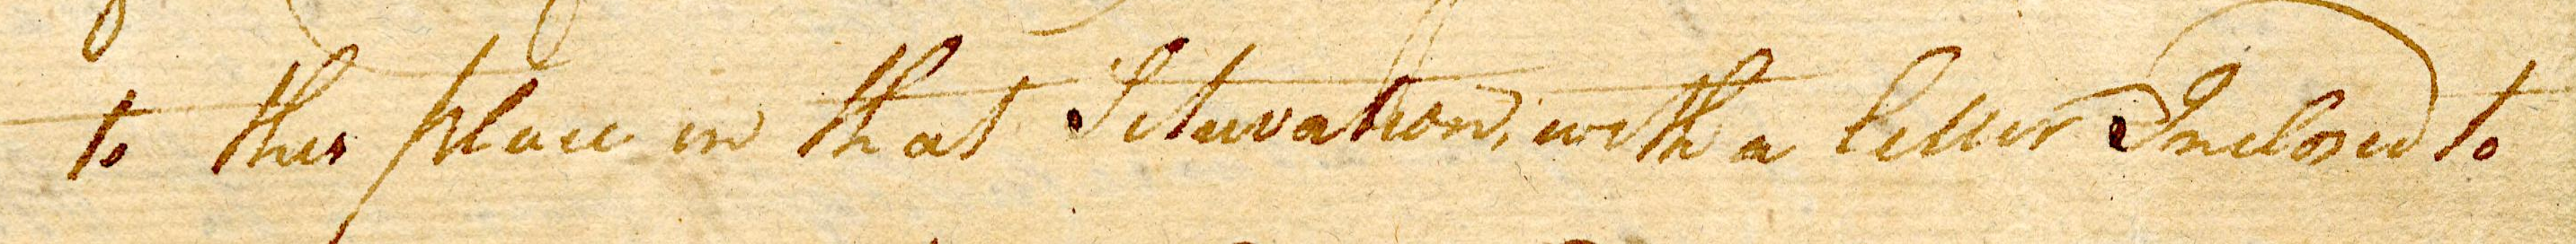to this place in that Situation with a letter Inclosed to
